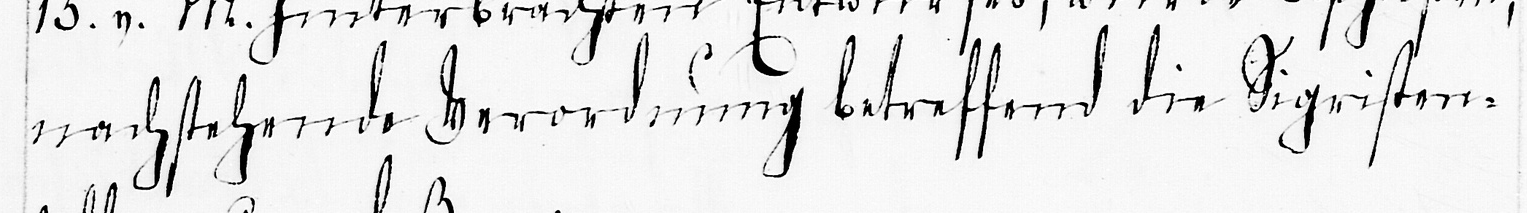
nachstehende Verordnung betreffend die Sigristen¬
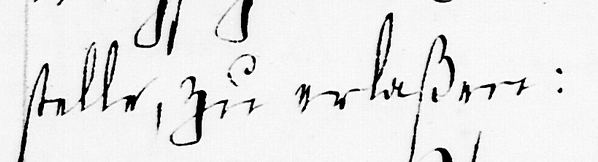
stelle, zu erlaßen:
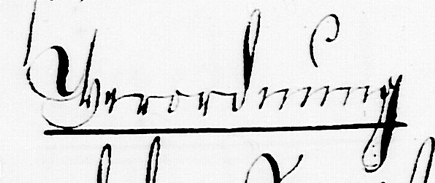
Verordnung
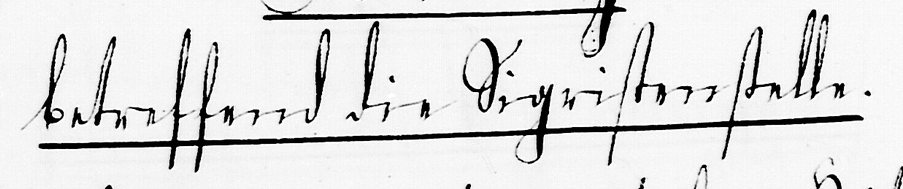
betreffend die Sigristenstell¬
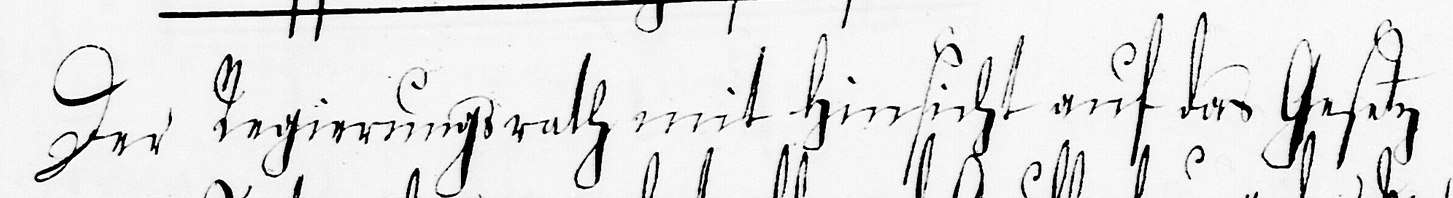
Der Regierungsrath mit Hinsicht auf das Gesetz
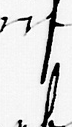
e.
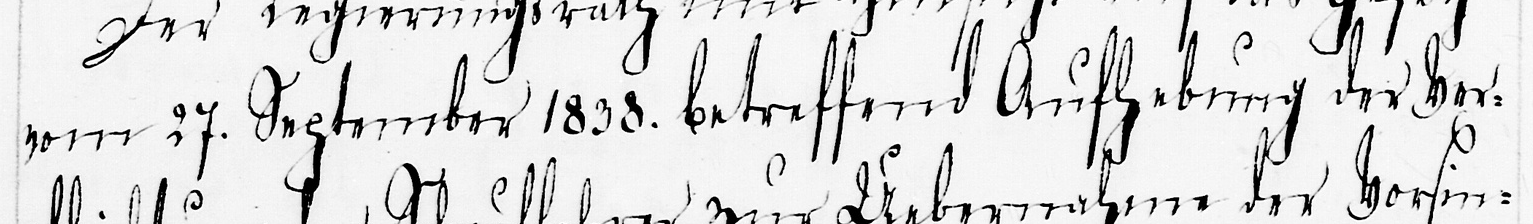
vom 27. September 1838. betreffend Aufhebung der Ver¬
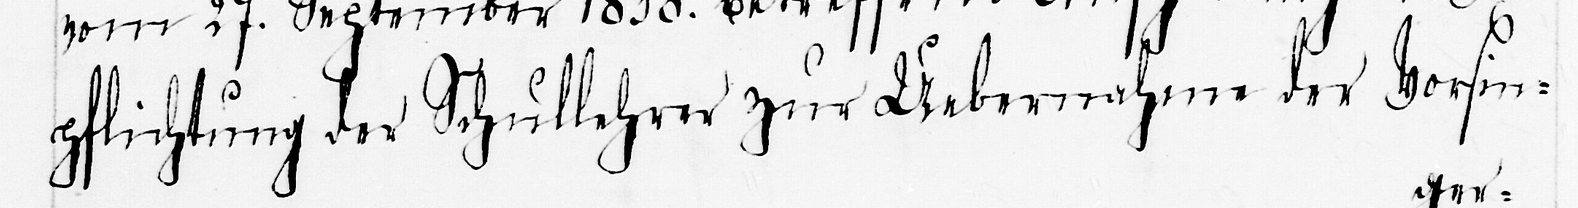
pflichtung der Schullehrer zur Uebernahme der Vorsin-
